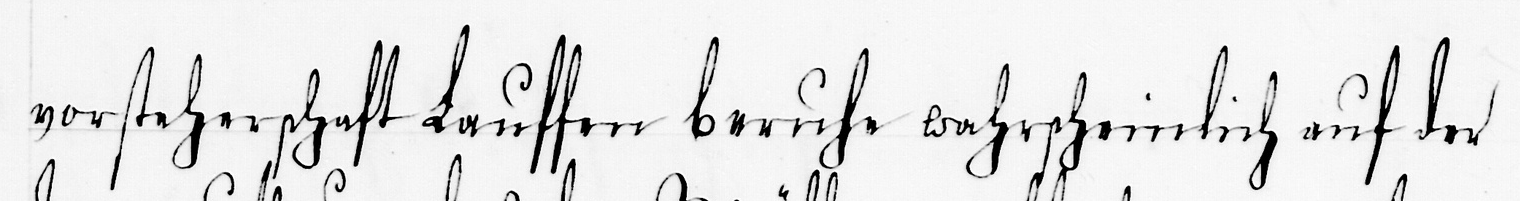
orsteherschaft Lauffen beruhe wahrscheinlich auf der
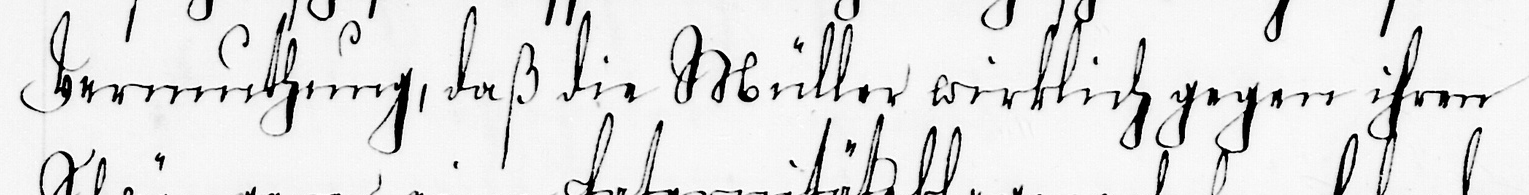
Vermuthung, daß die Müller wirklich gegen ihren
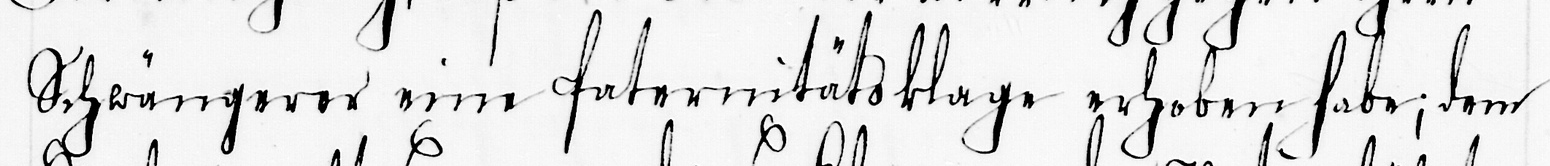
Schwängerer eine Paternitätsklage erhoben habe; dem
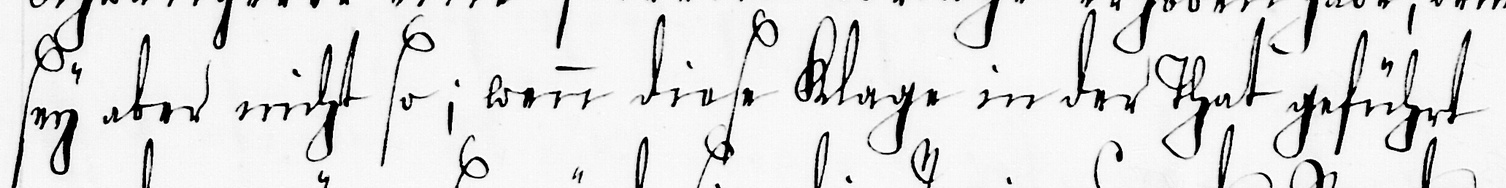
sey aber nicht so; wenn diese Klage in der That geführt
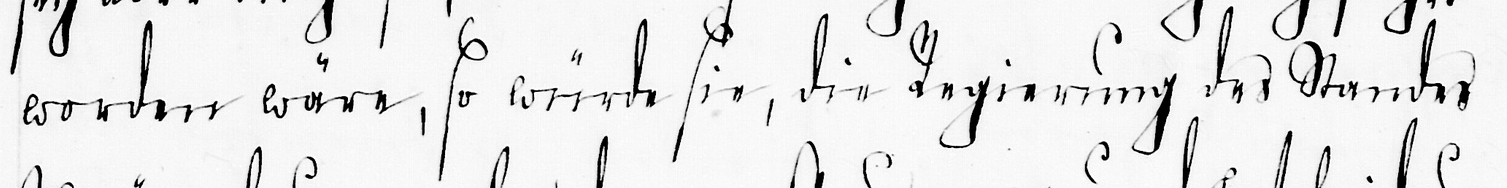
worden wäre, so würde sie, die Regierung des Standes
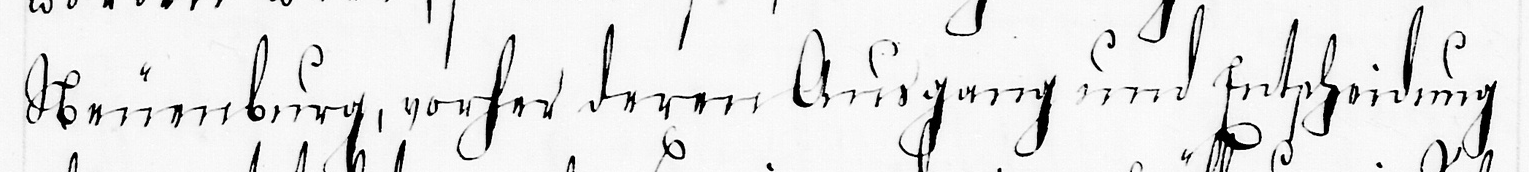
Neuenburg, vorher deren Ausgang und Entscheidung
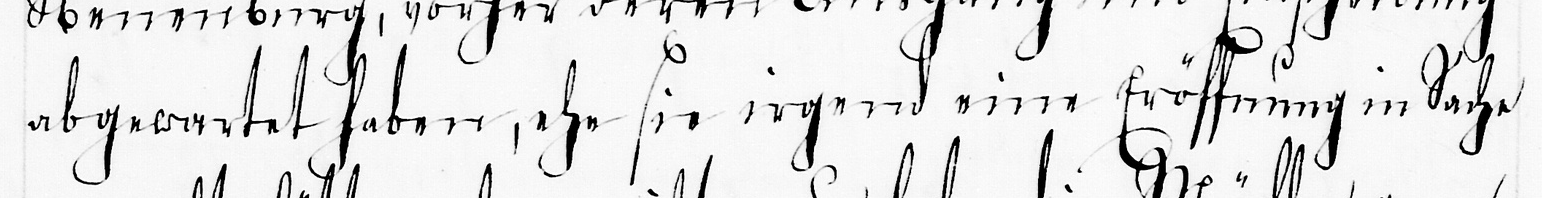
abgewartet haben, ehe sie irgend eine Eröffnung in Sache
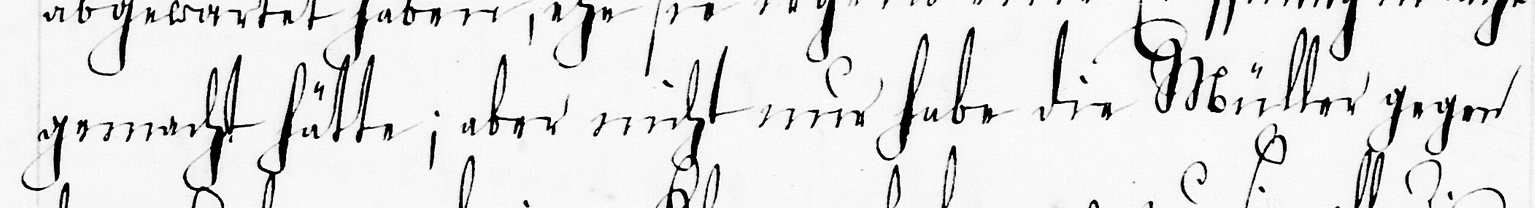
gemacht hätte; aber nicht nur habe die Müller gegen
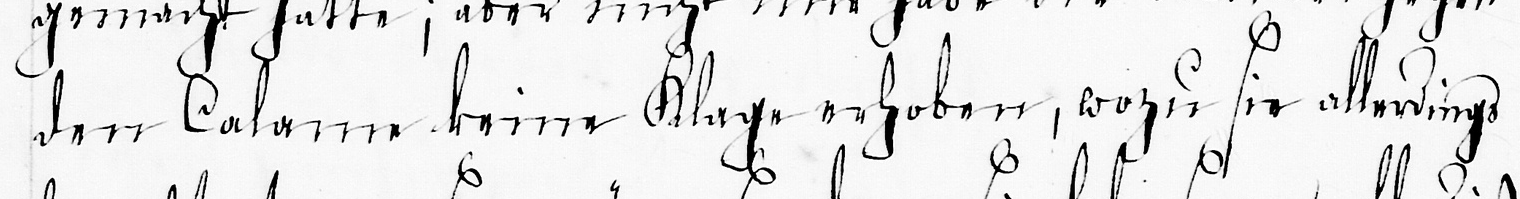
den Calame keine Klage erhoben, wozu sie allerdings
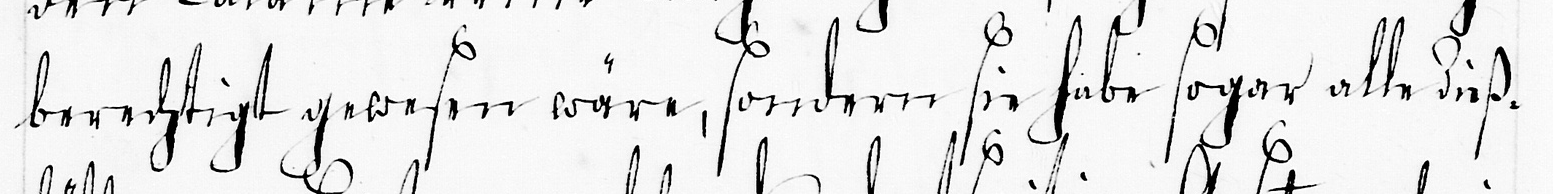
berechtigt gewesen wäre, sondern sie habe sogar alle dieß¬
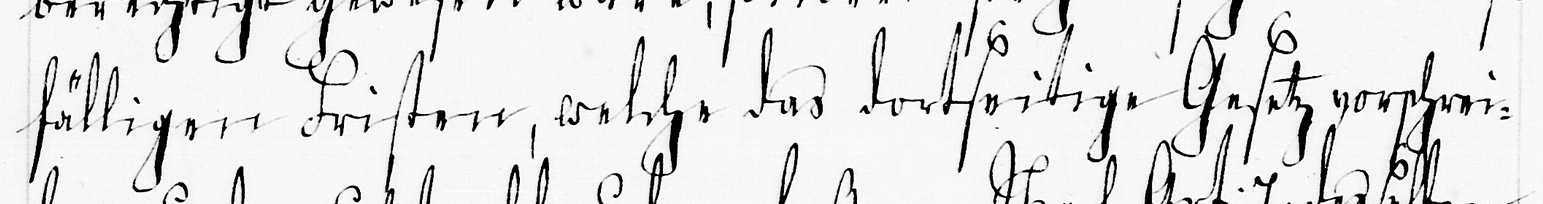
fälligen Fristen, welche das dortseitige Gesetz vorschre¬
